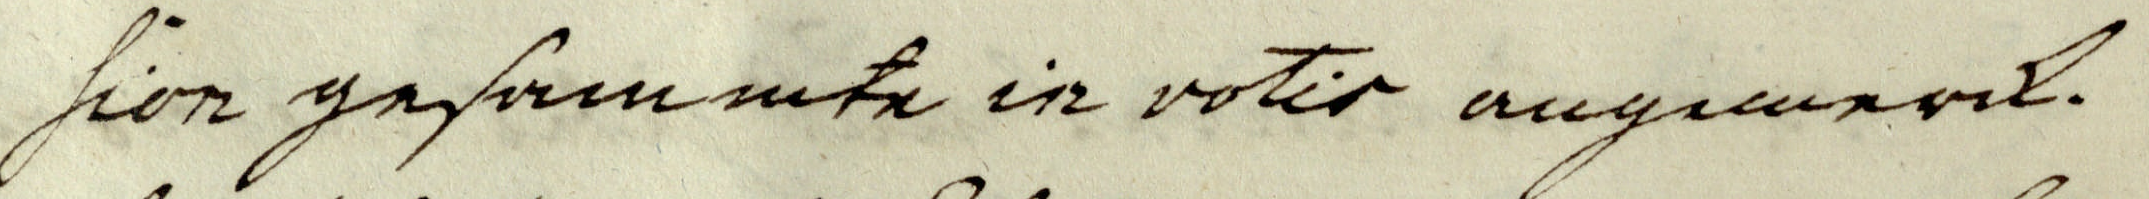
sion gesammte in votis angemerk¬
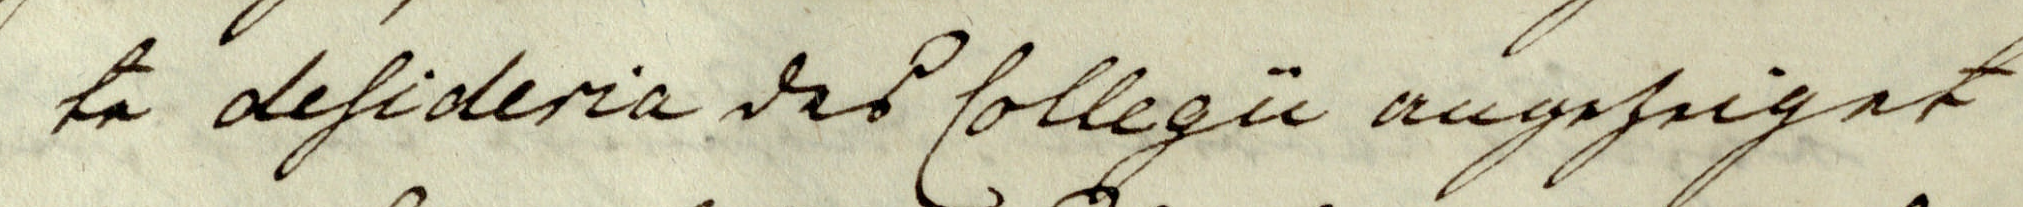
te desideria des Collegii angezeiget
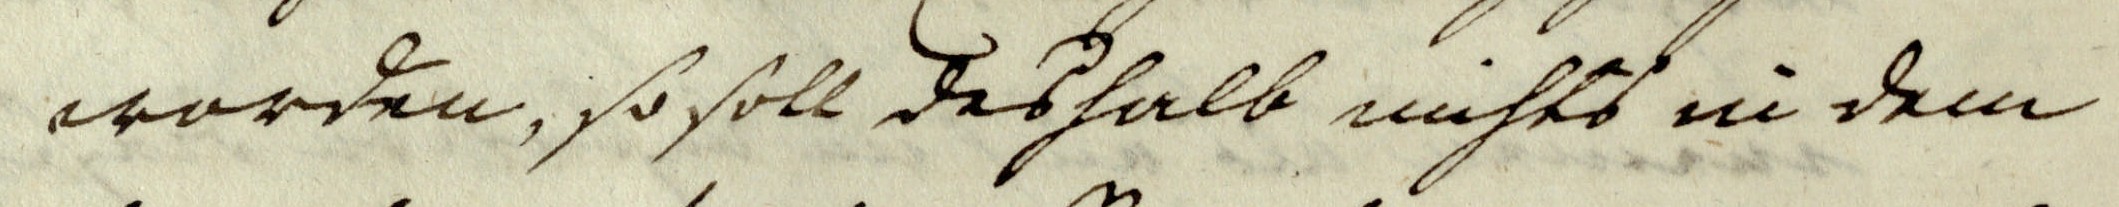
worden, so soll deshalb nichts in dem
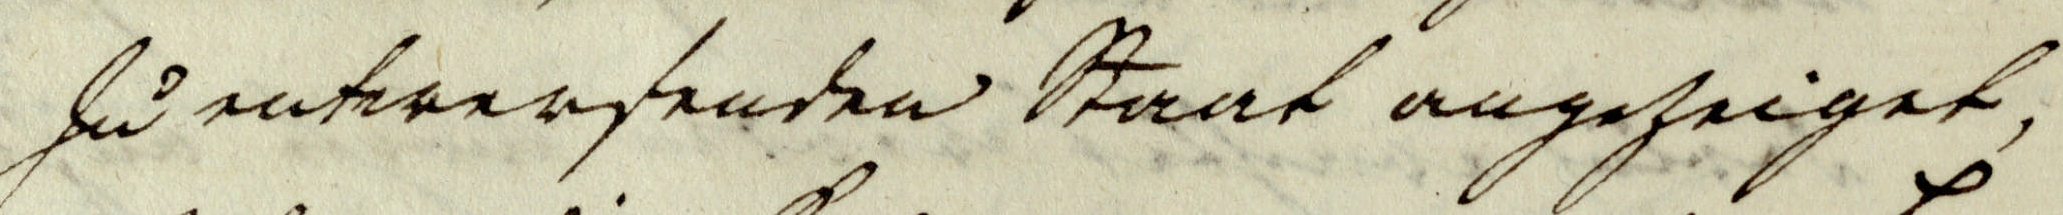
zu entwerfenden Staat angezeiget,
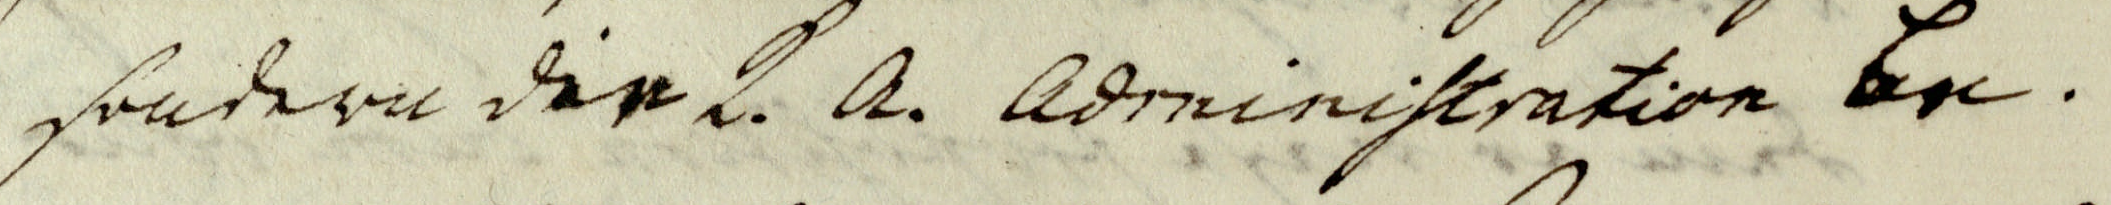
sondern die K. A. Administration be¬
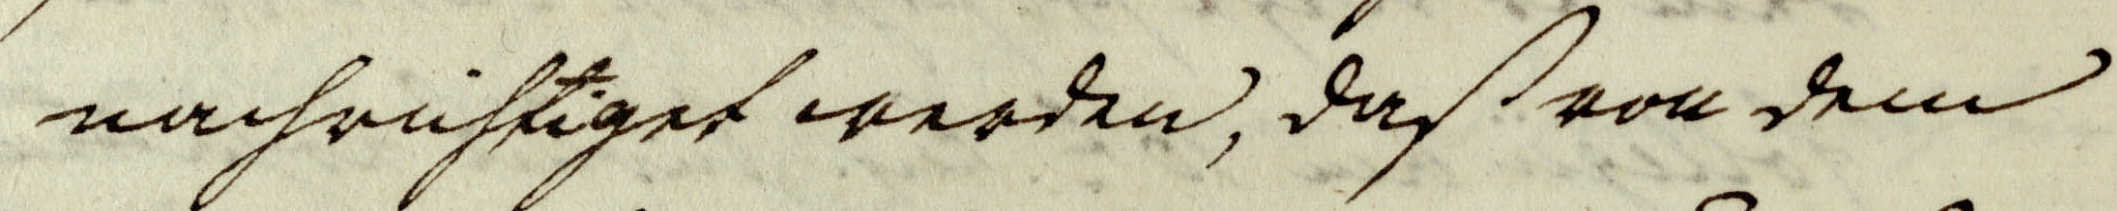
nachrichtigt werden, daß von dem
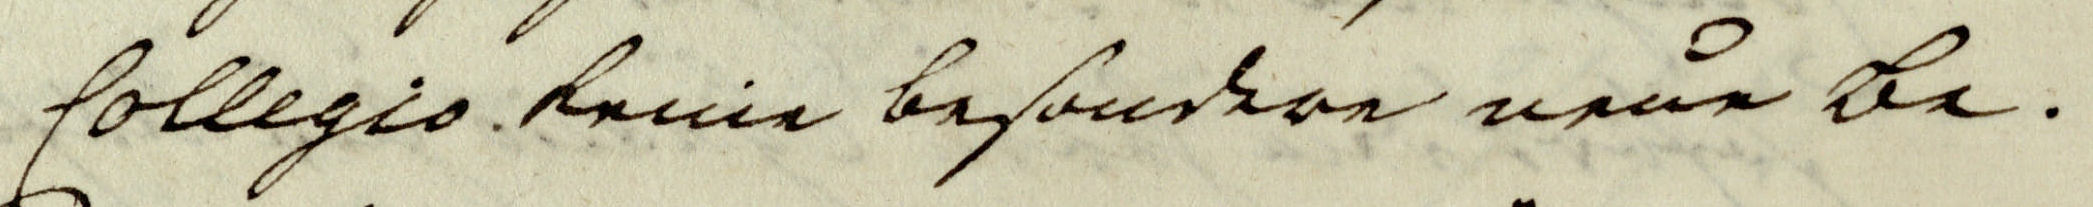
Collegio keine besondern neue Be¬
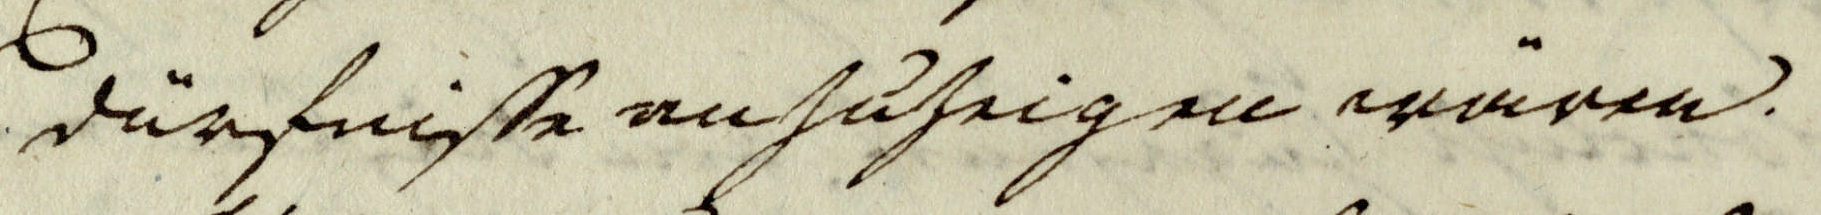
dürfnisse anzuzeigen wären.
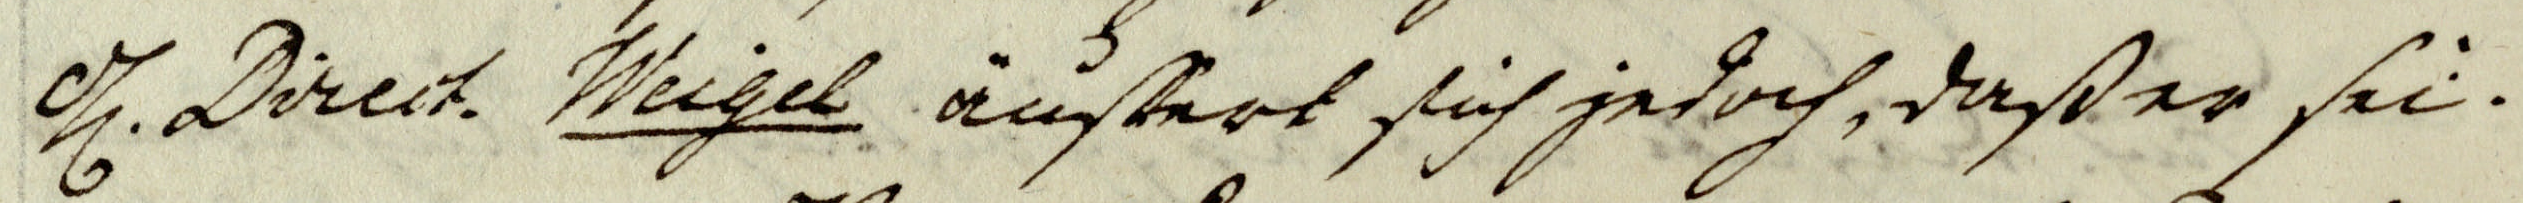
dh. Direct. Weigel äussert sich jedoch, daß er sei¬
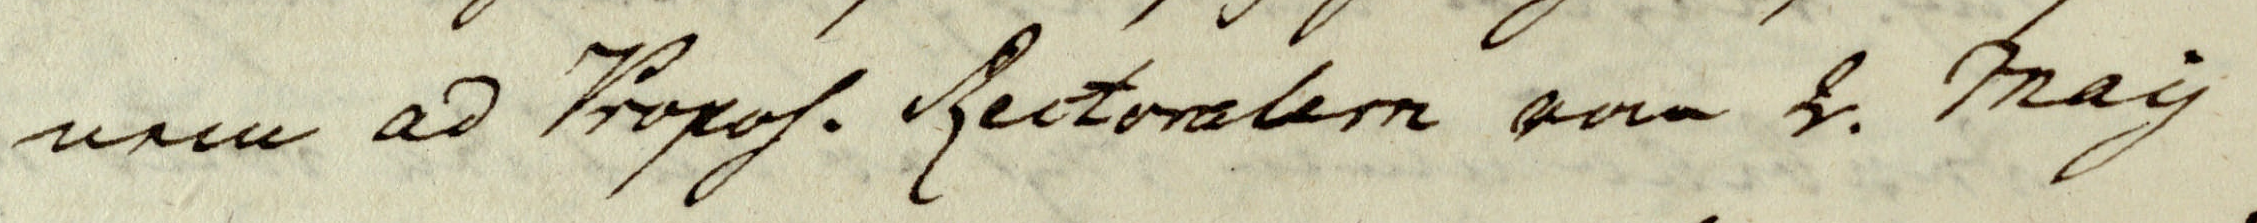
nem ad Propos. Rectoralem vom 2. Maÿ
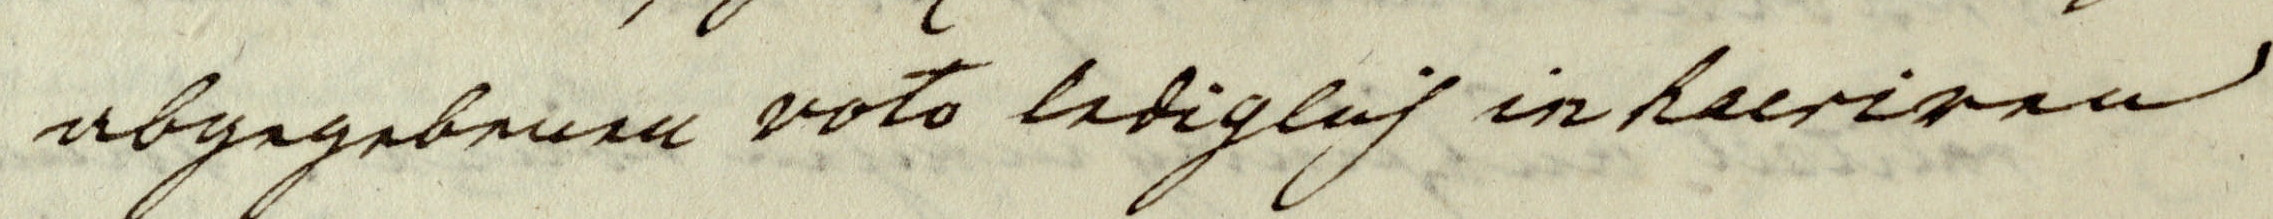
abgegebenen voto lediglich inhaeriren
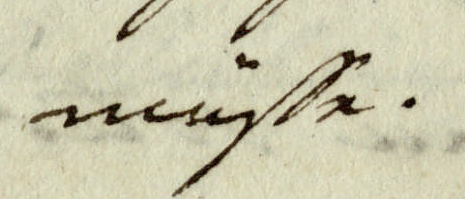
müsse.
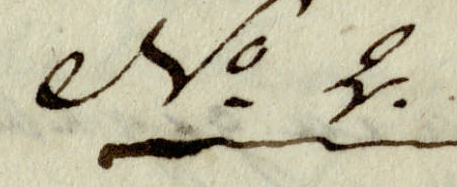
No 2.
